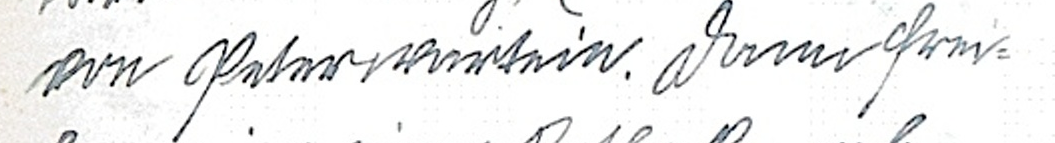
von Petrovaradin. Dann Frei-
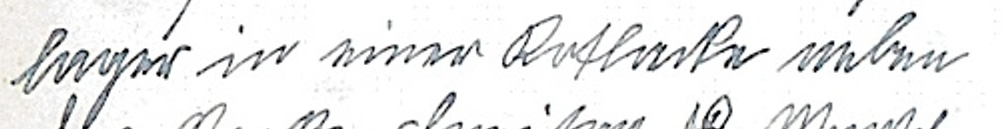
lager in einer Kotlacke neben
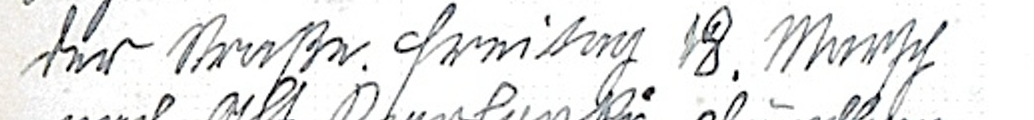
der Straße- Freitag 18. Marsch
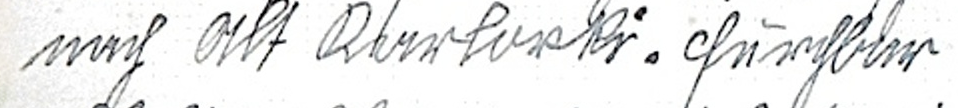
nach Alt Karlovčići. Furchtbar
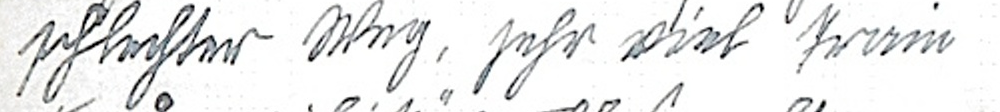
schlechter Weg, sehr viel Train
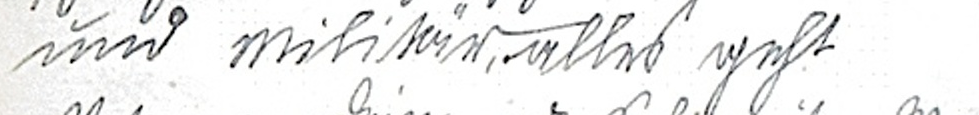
und Militär. Alles geht
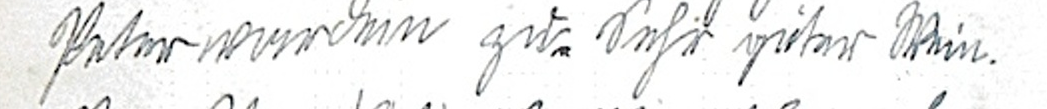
Petrovaradin zu. Sehr guter Wein
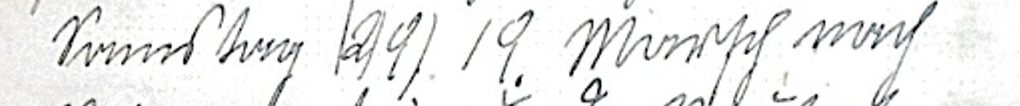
Samstag 19. Marsch nach
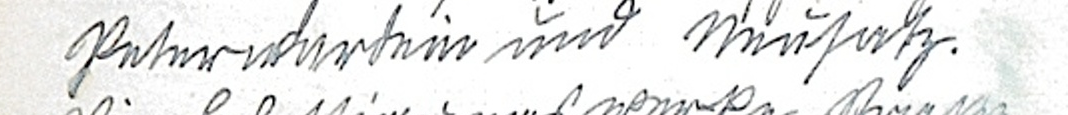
Petrovaradin und Neusatz.
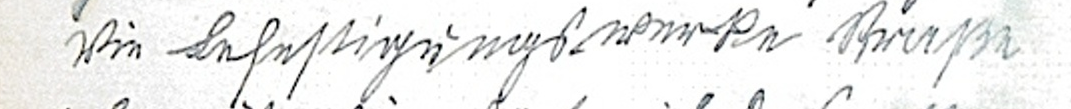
Die Befestigungswerke Straße
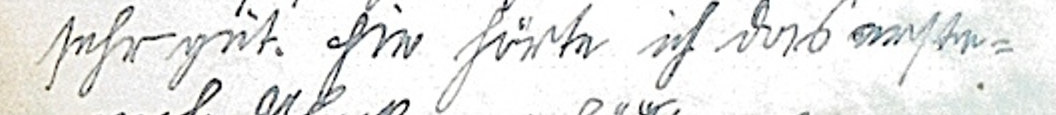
sehr gut. Hier hörte ich das erste-
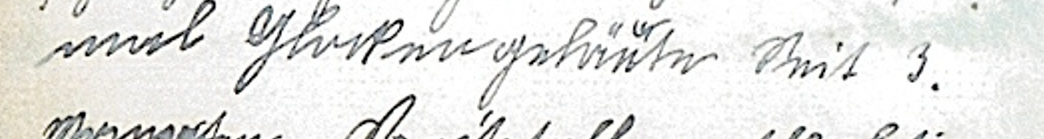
mal Glockengeläute seit 3.
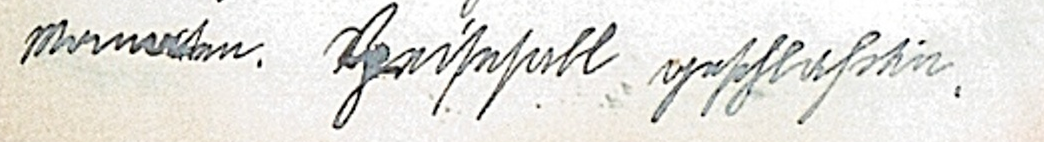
Monaten. Reisefall geschlafen
